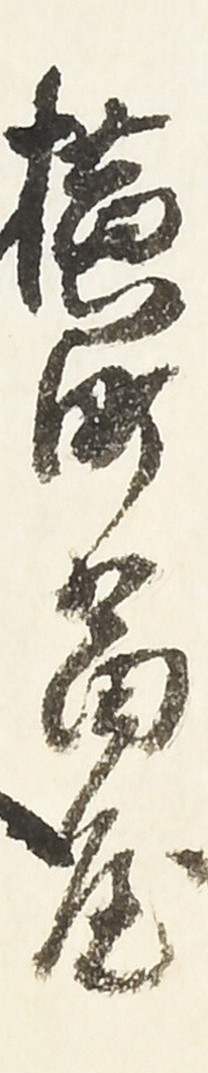横町冨屋
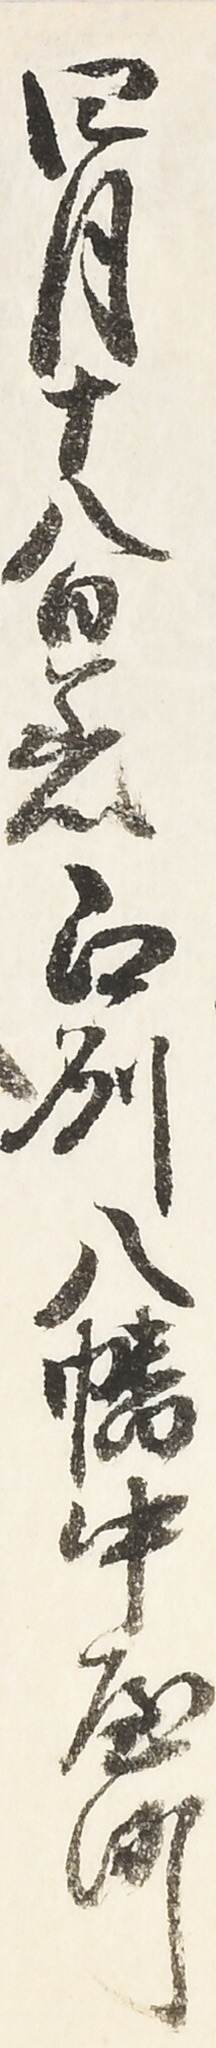四月十八日着江州八幡中屋町
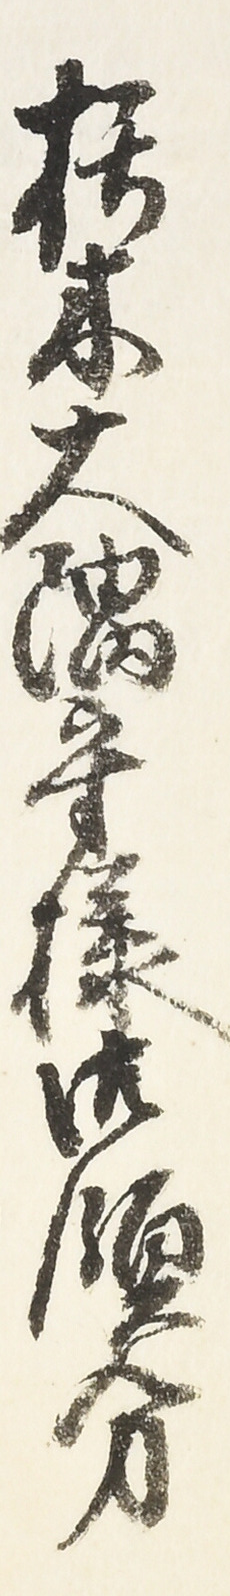朽木大隅守様御領分
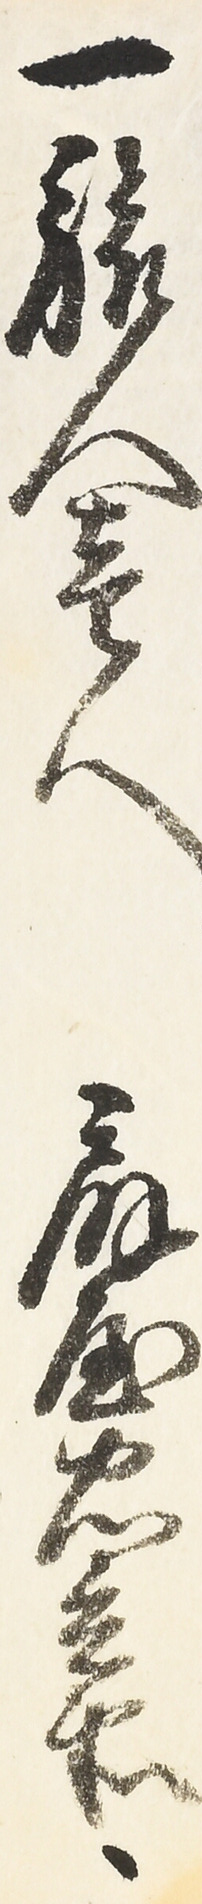一旅人壱人扇屋忠兵衛・
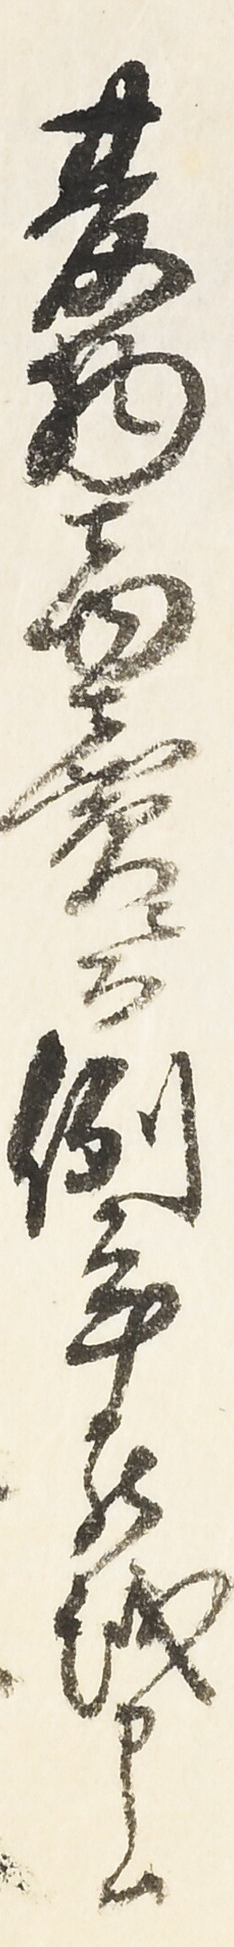夏物商売ニ而例年罷越申候
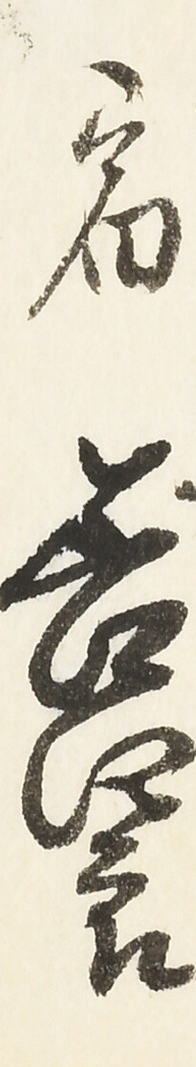宿善四郎
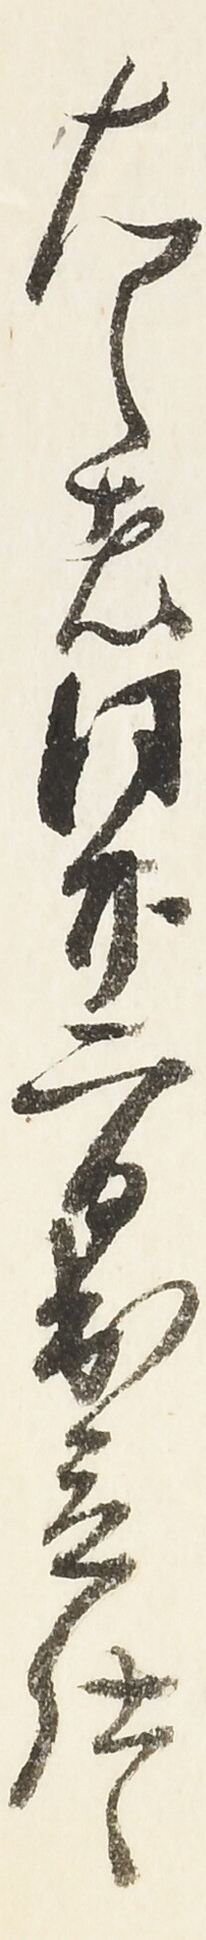右之者同廿二日出立仕候
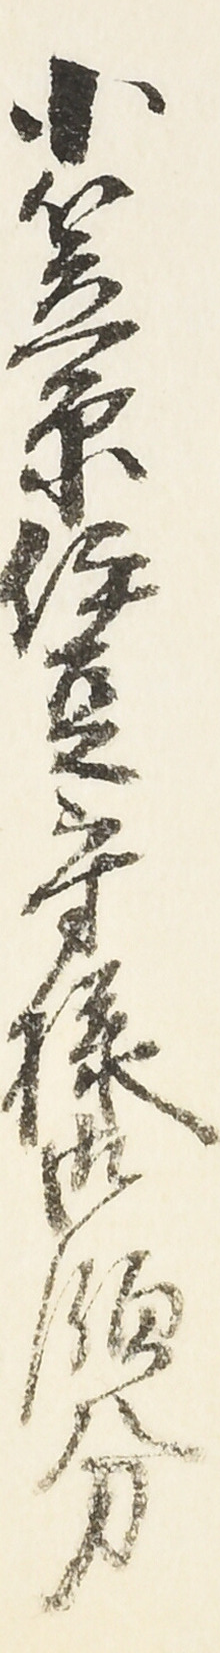小笠原伊豆守様御領分
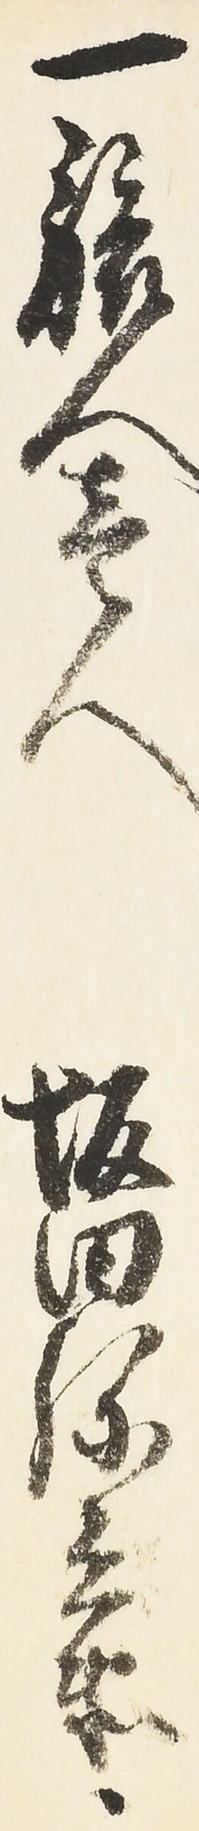一旅人壱人坂田弥兵衛・
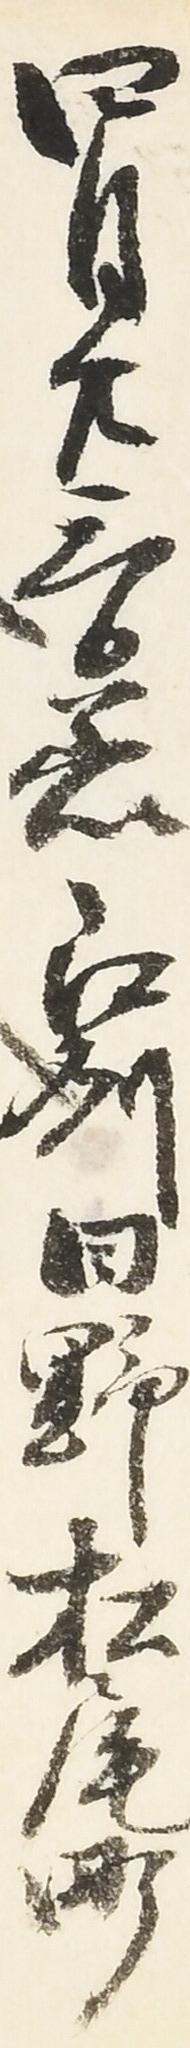四月廿三日着江州日野松尾町
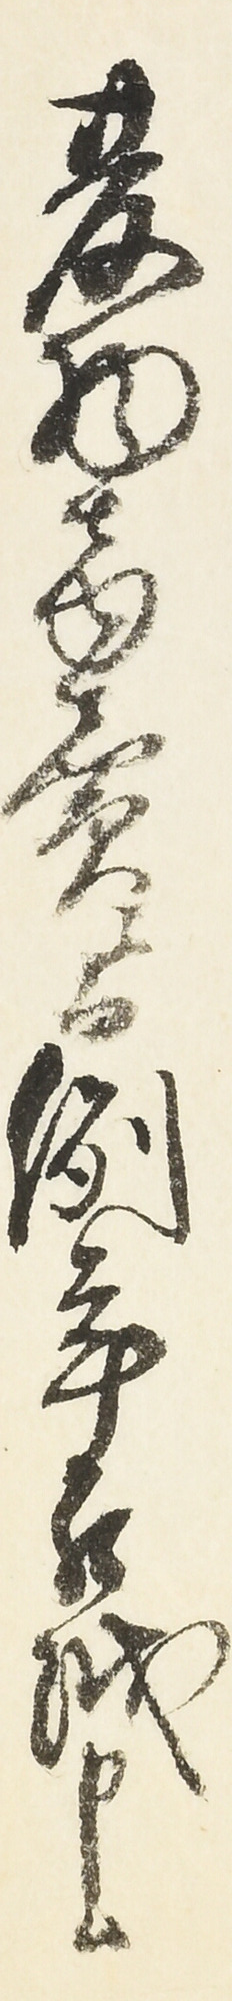夏物商売ニ而例年罷越申候
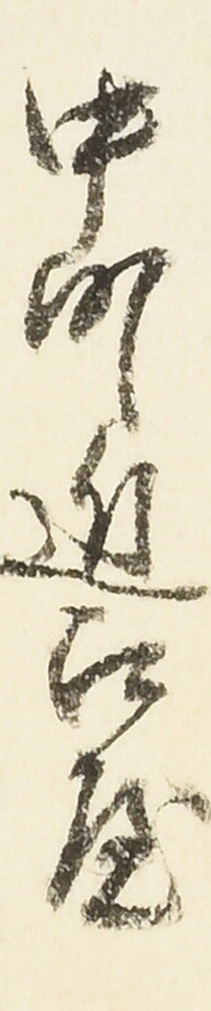中町近江屋
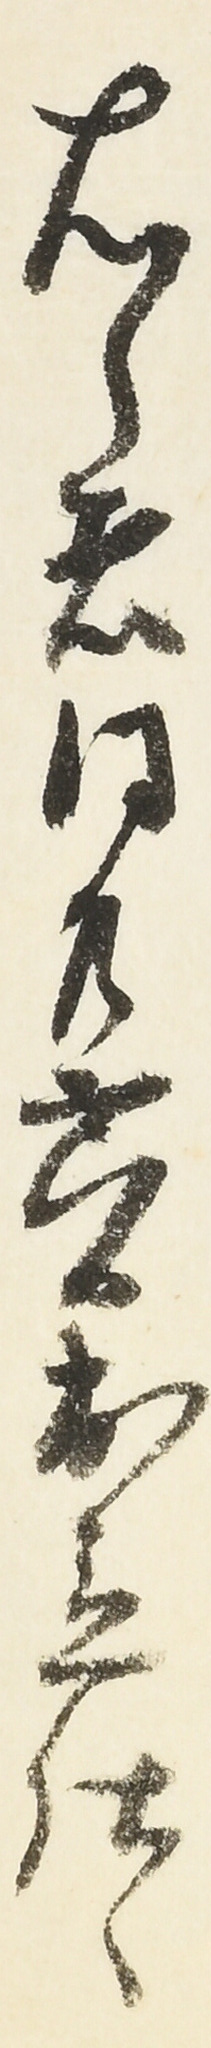右之者同廿六日出立仕候
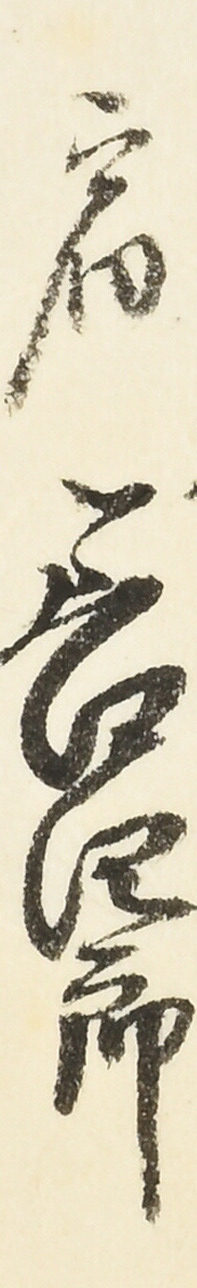宿善四郎
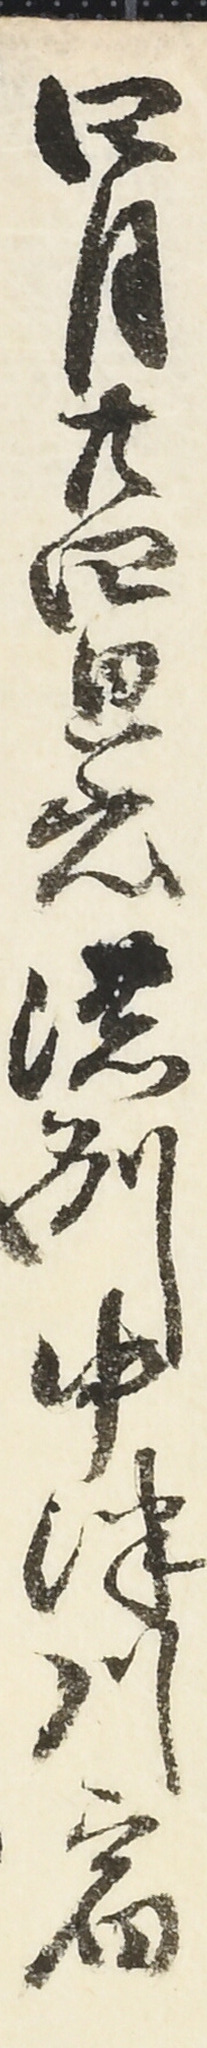四月廿四日着濃州中津川宿
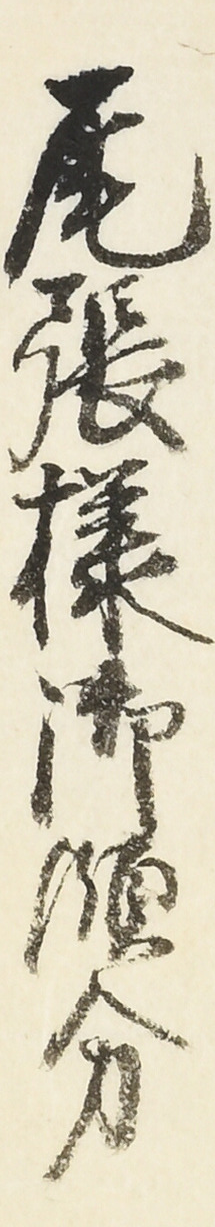尾張様御領分
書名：町中旅人泊控帳
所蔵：伊那市立高遠町図書館・合同会社AMANE
